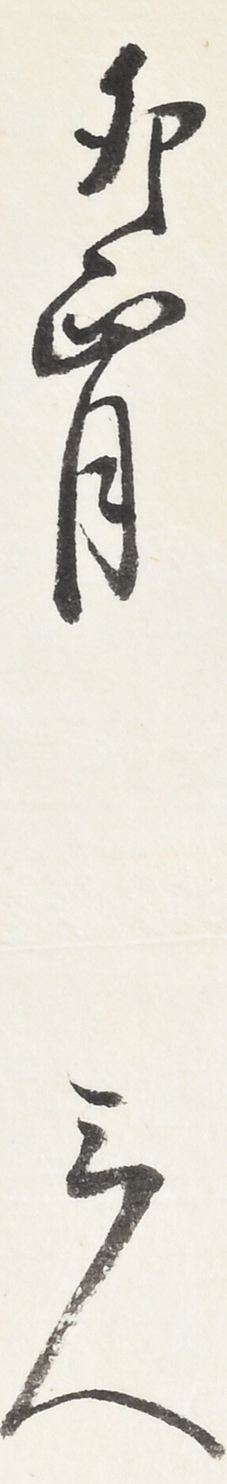卯正月三人

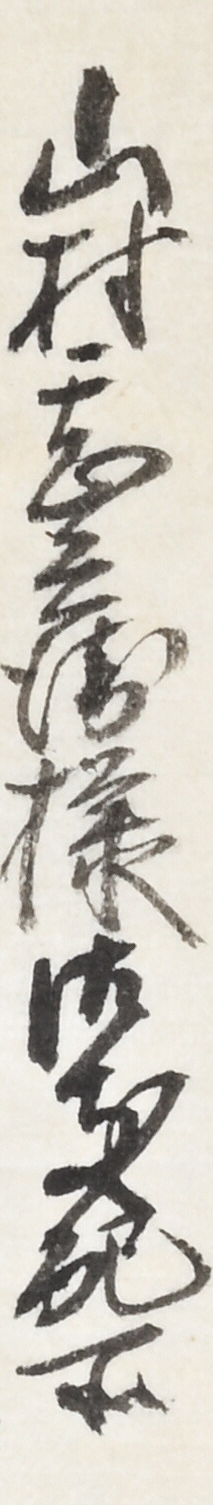山村甚兵衛様御支配所
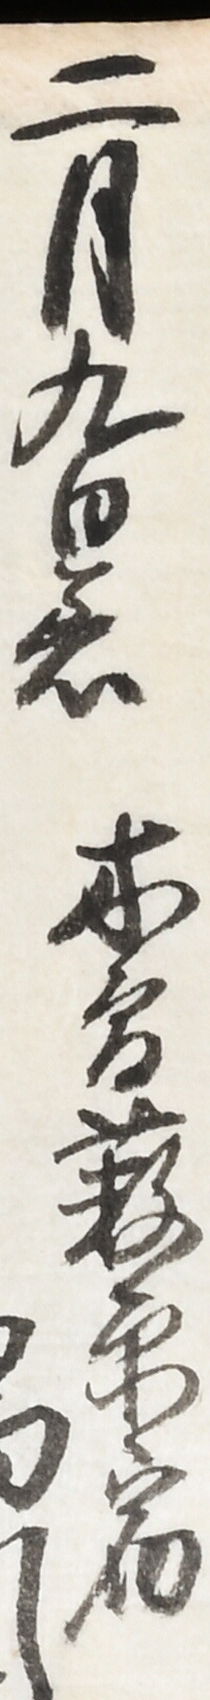二月九日着木曽藪原宿
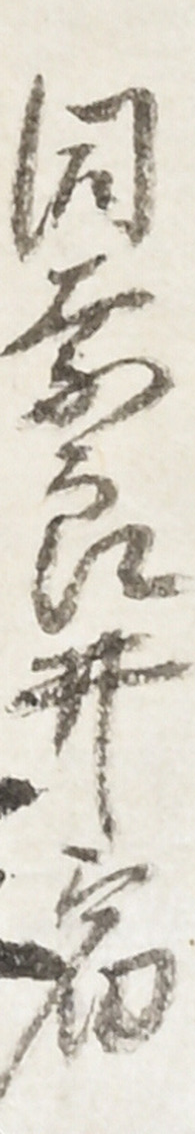同奈良井宿
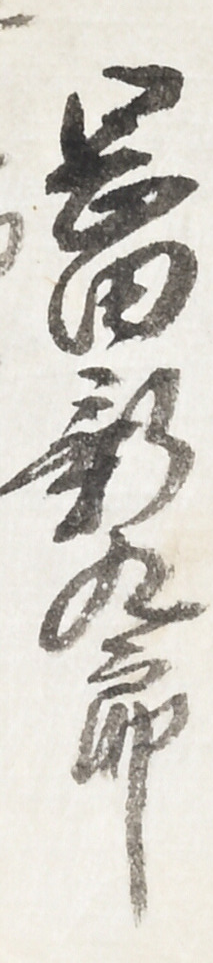岡田新九郎
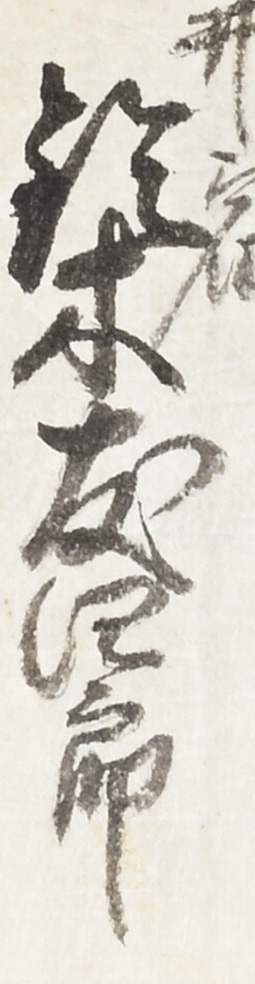鈴木友四郎
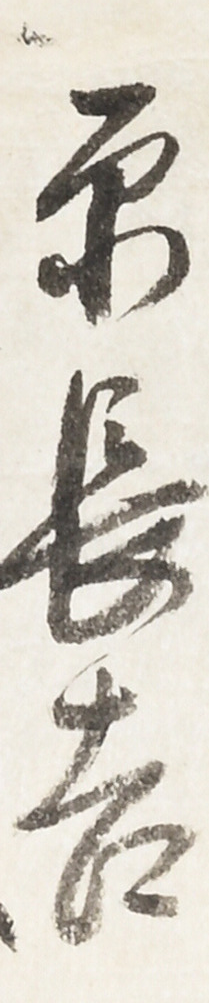原長吉
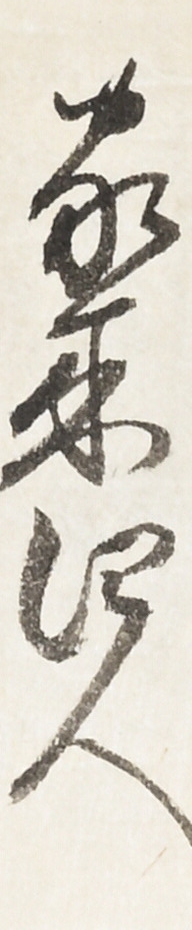家来四人
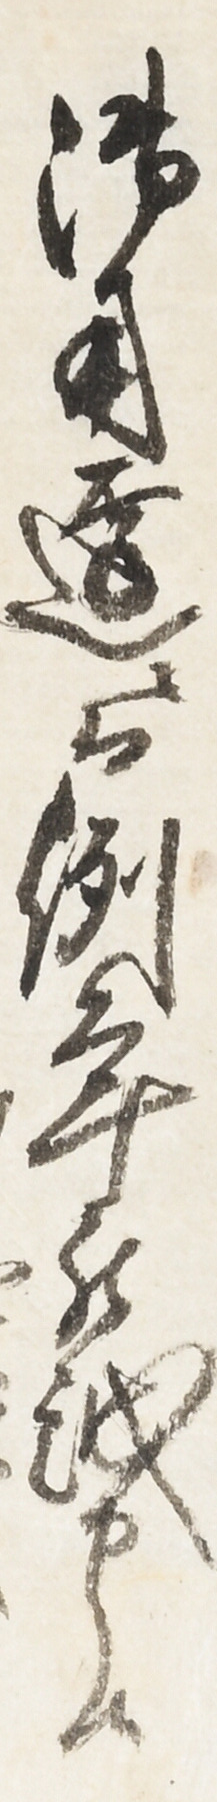御用達ニ而例年罷越申候
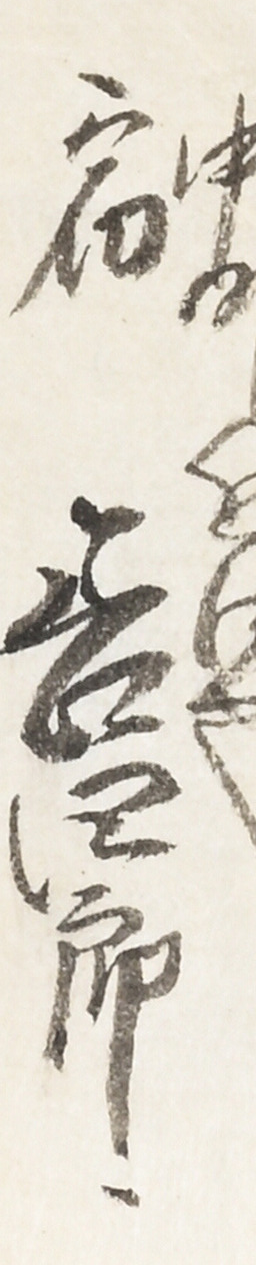宿善四郎
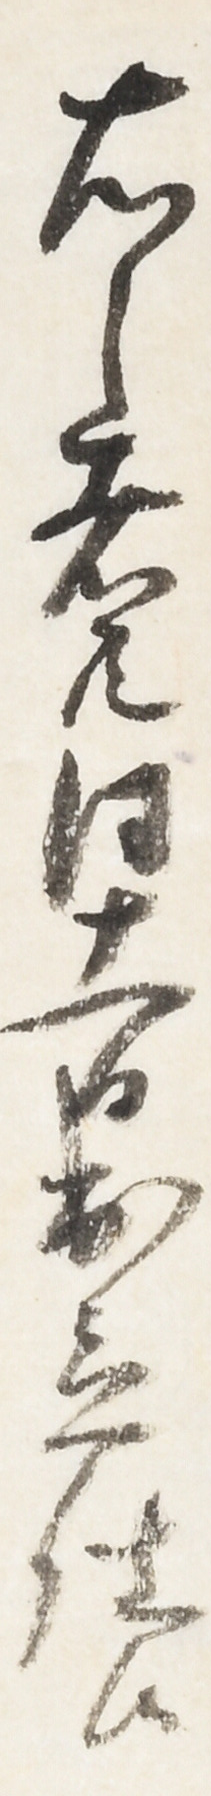右之者共同十一日出立仕候
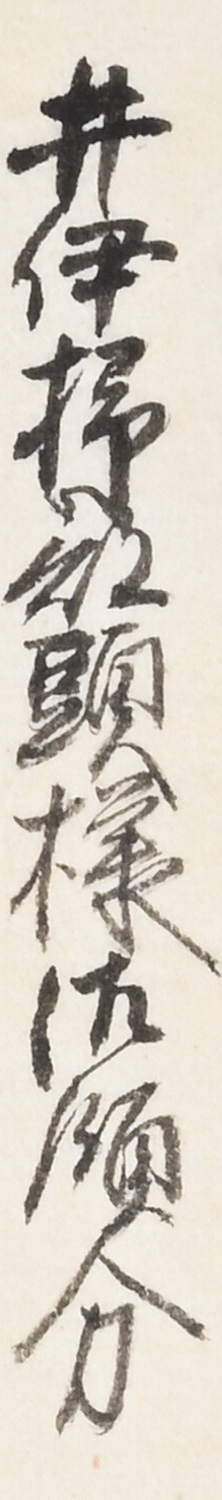井伊掃部頭様御領分
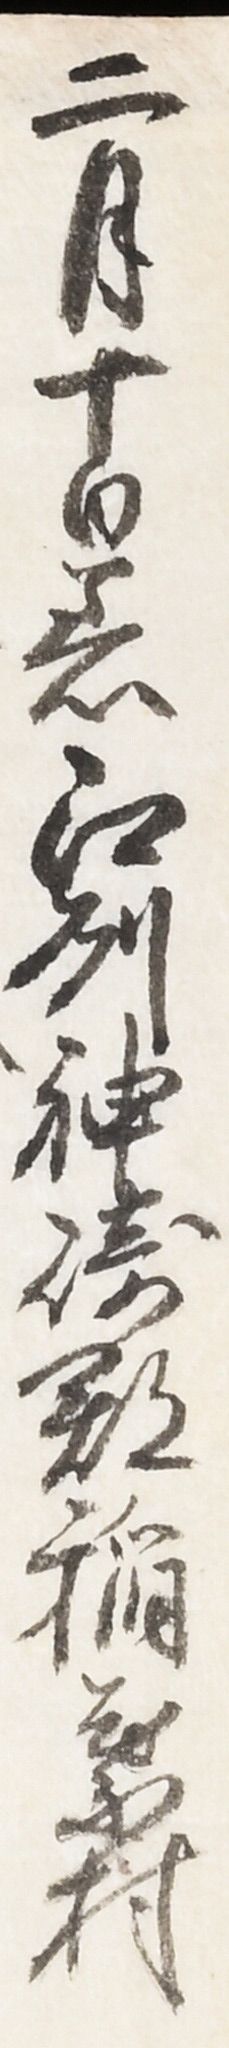二月十日着江州神崎郡稲葉村
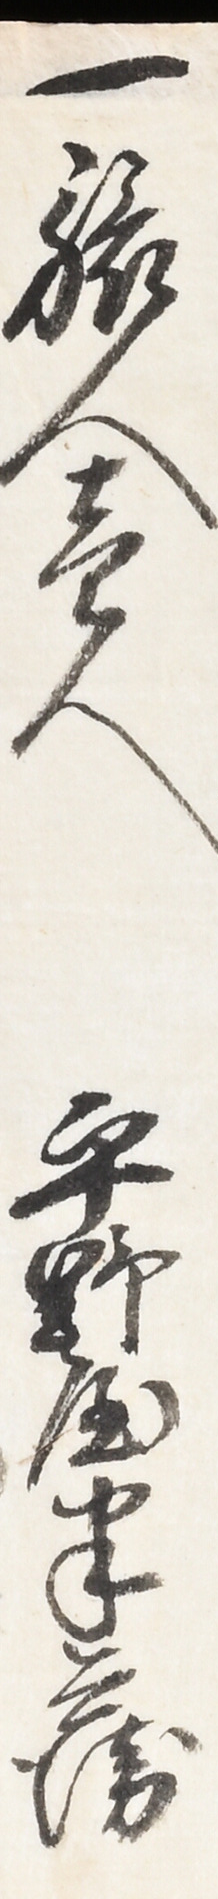一旅人壱人平野屋半兵衛
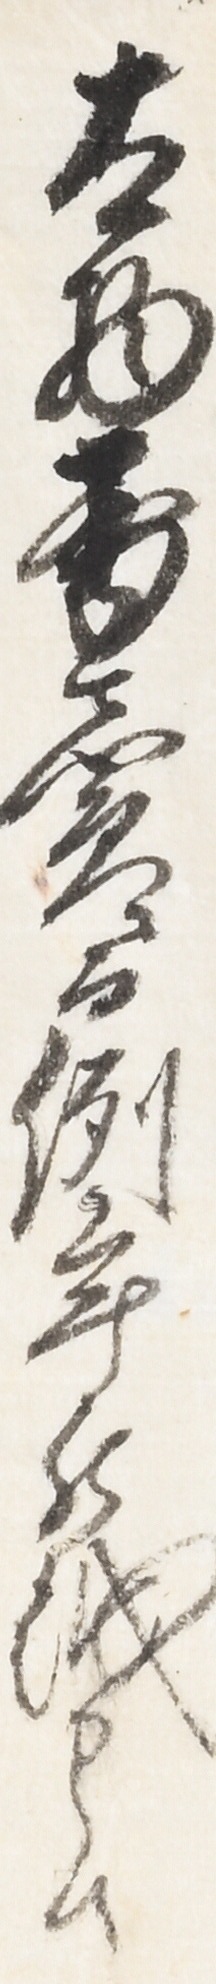太物商売ニ而例年罷越申候
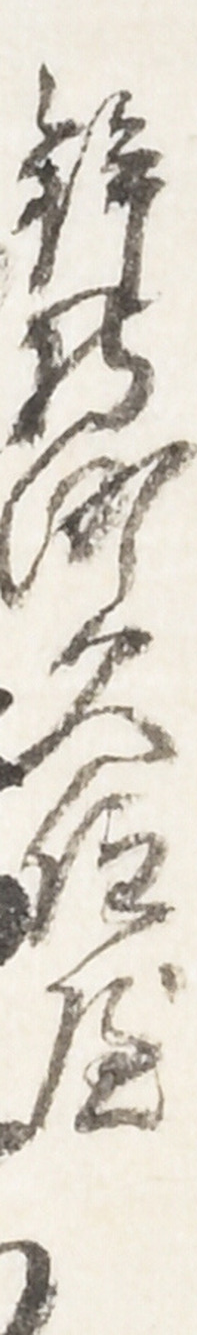鉾持町久住屋
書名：旅人泊控帳
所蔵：伊那市立高遠町図書館・合同会社AMANE
